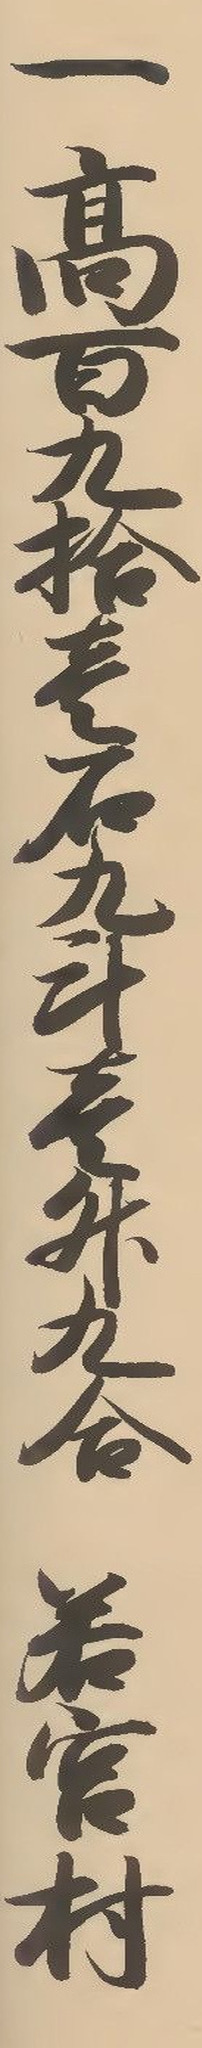一高百九拾壱石九斗壱升九合若宮村
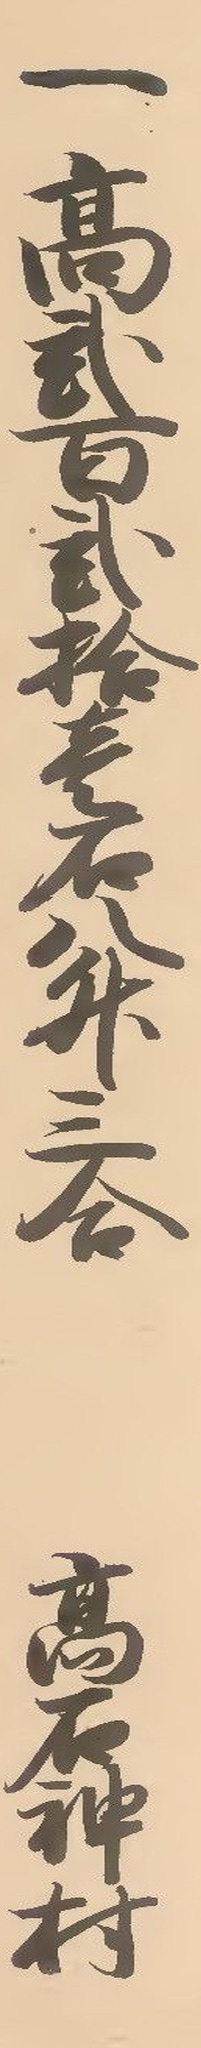一高弐百弐拾壱石八升三合高石神村
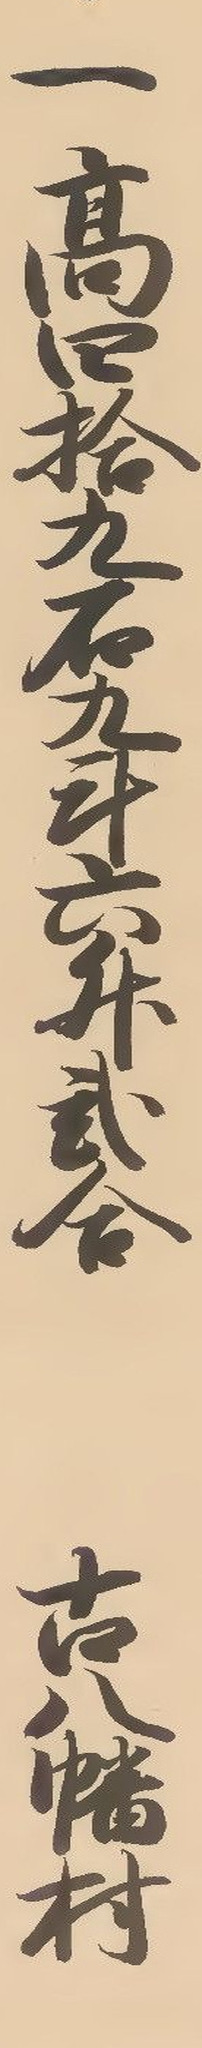一高四拾九石九斗六升弐合古八幡村
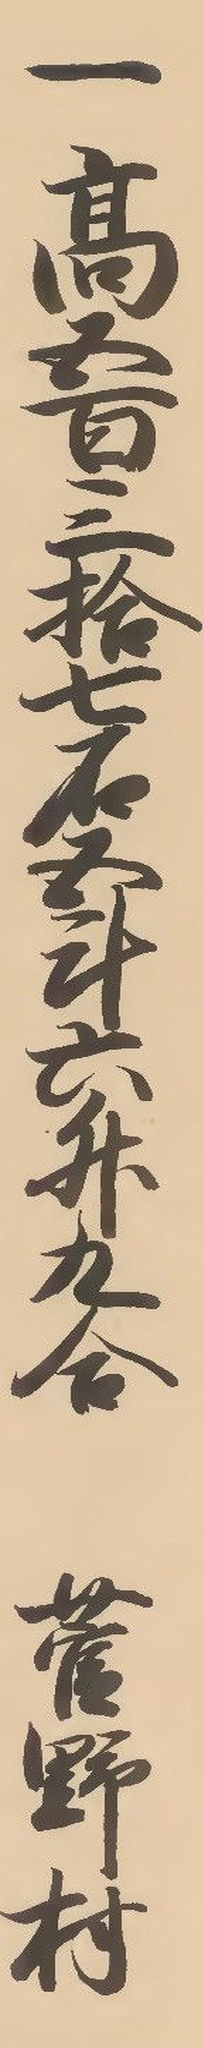一高五百三拾七石五斗六升九合菅野村
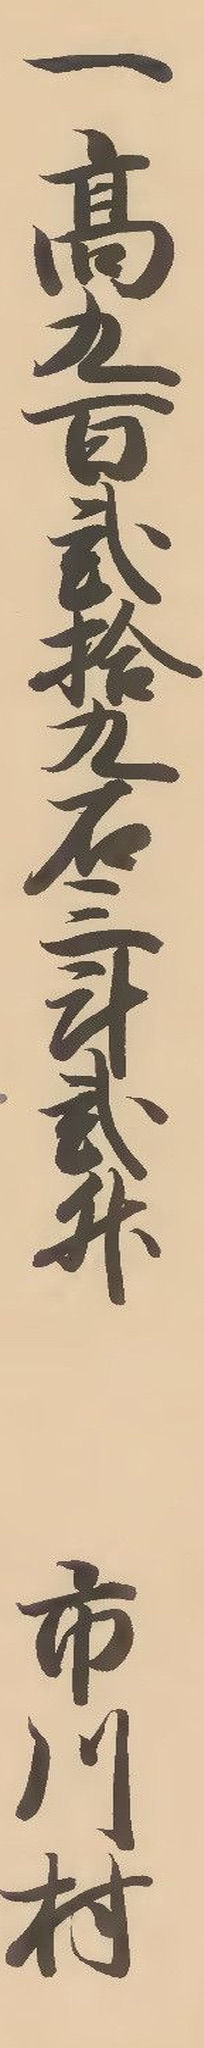一高九百弐拾九石三斗弐升市川村

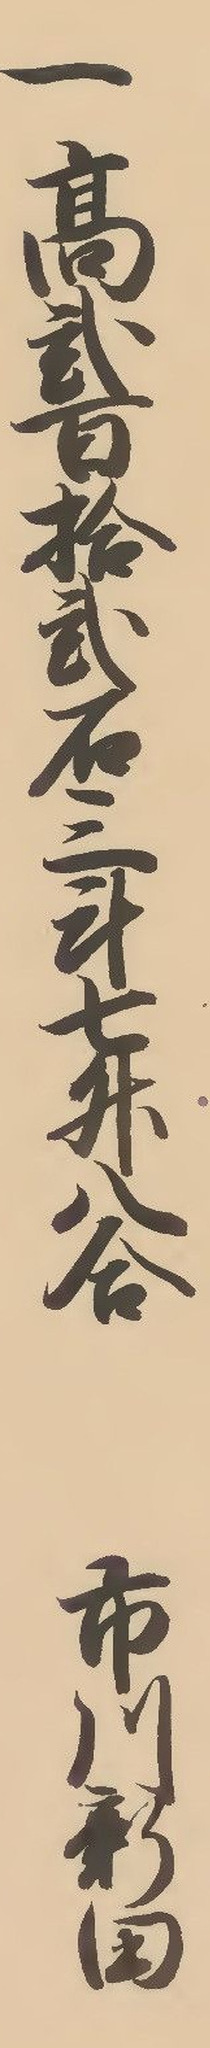一高弐百拾弐石三斗七升八合市川新田
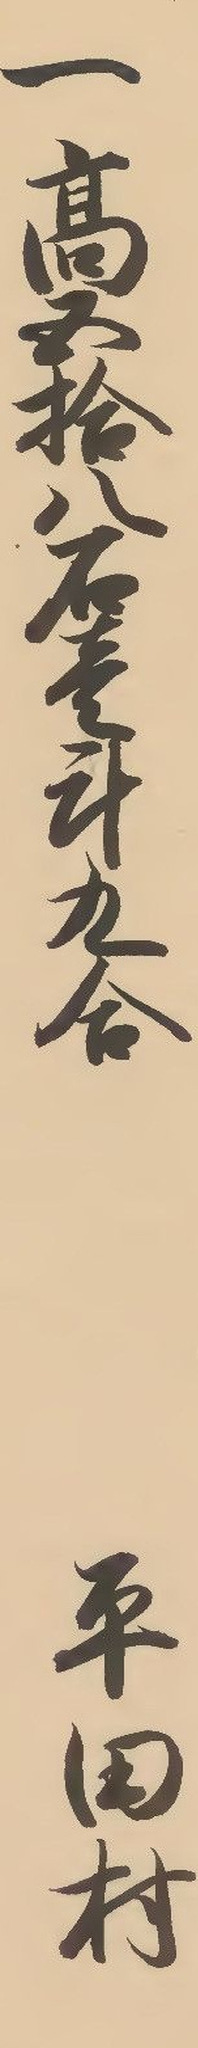一高五拾八石壱斗九合平田村
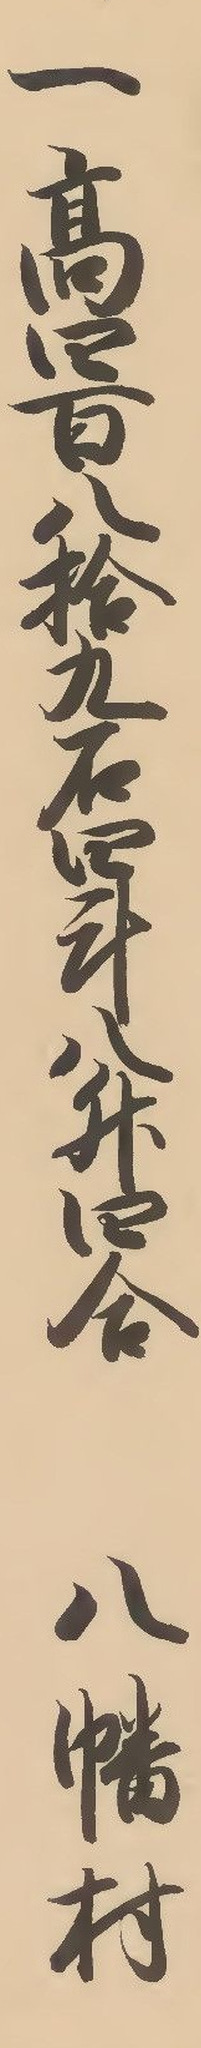一高四百八拾九石四斗八升四合八幡村
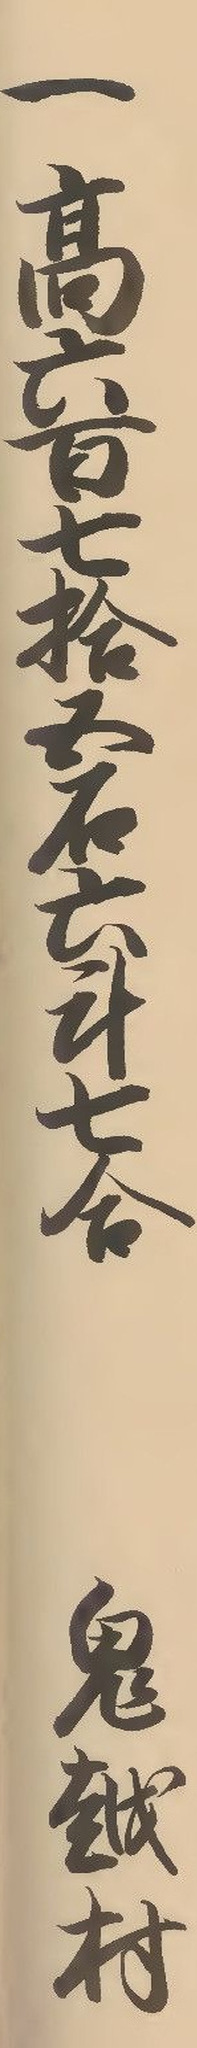一高六百七拾五石六斗七合鬼越村
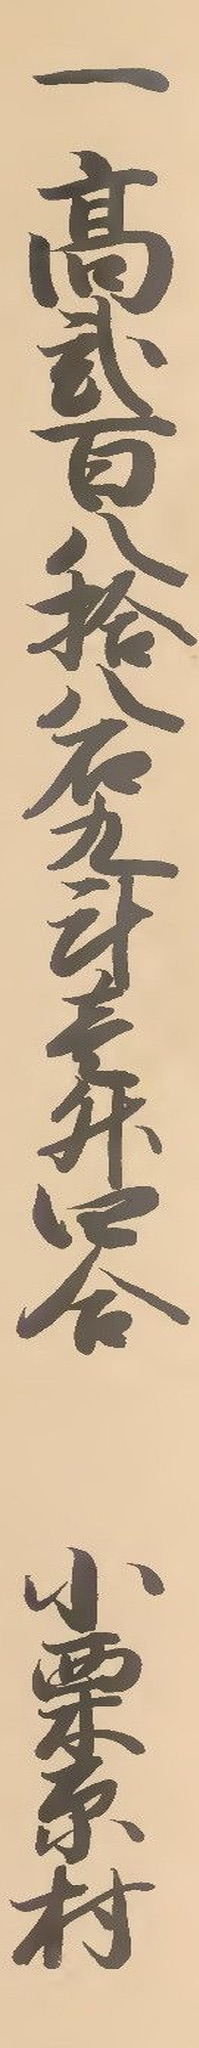一高弐百八拾八石九斗壱升四合小栗原村
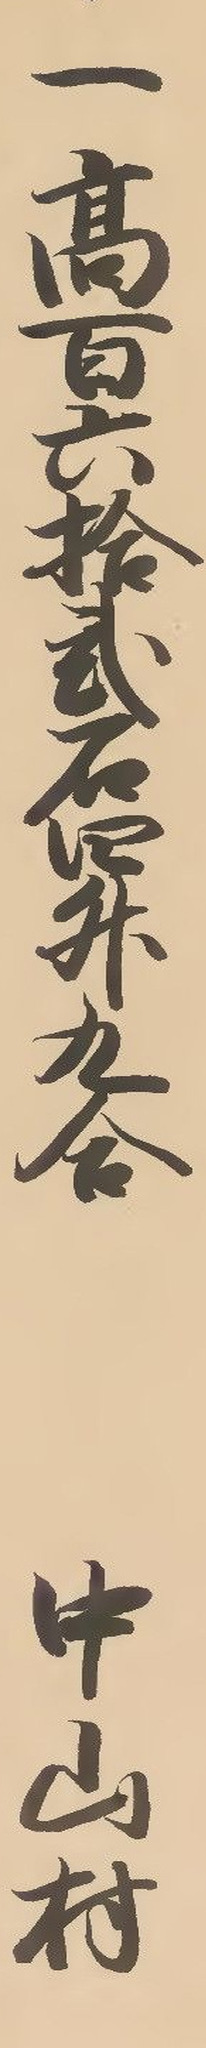一高百六拾弐石四升九合中山村
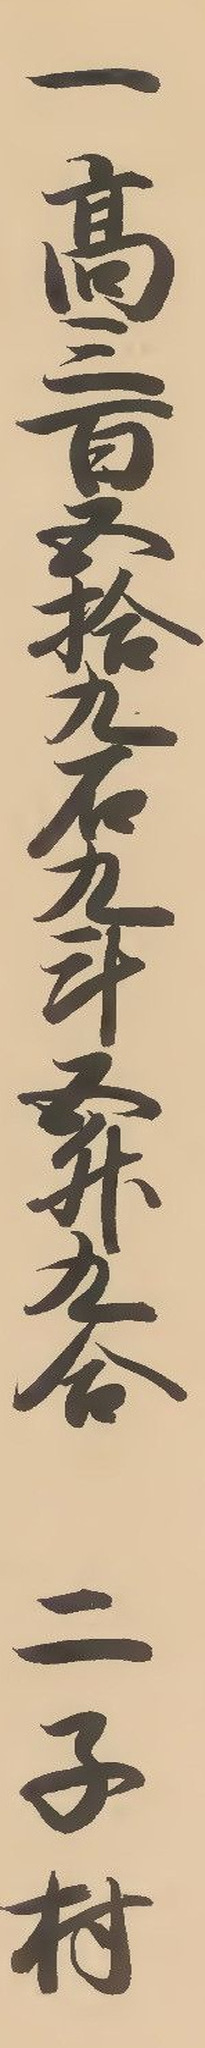一高三百五拾九石九斗五升九合二子村
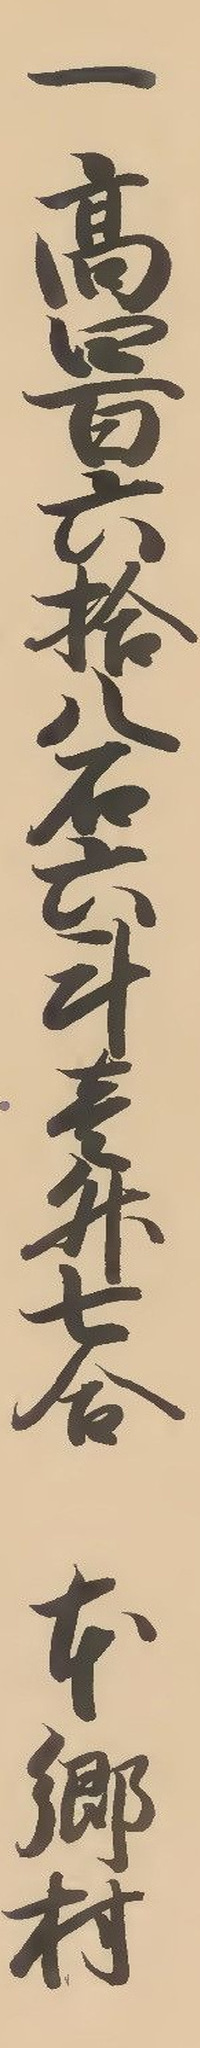一高四百六拾八石六斗壱升七合本郷村

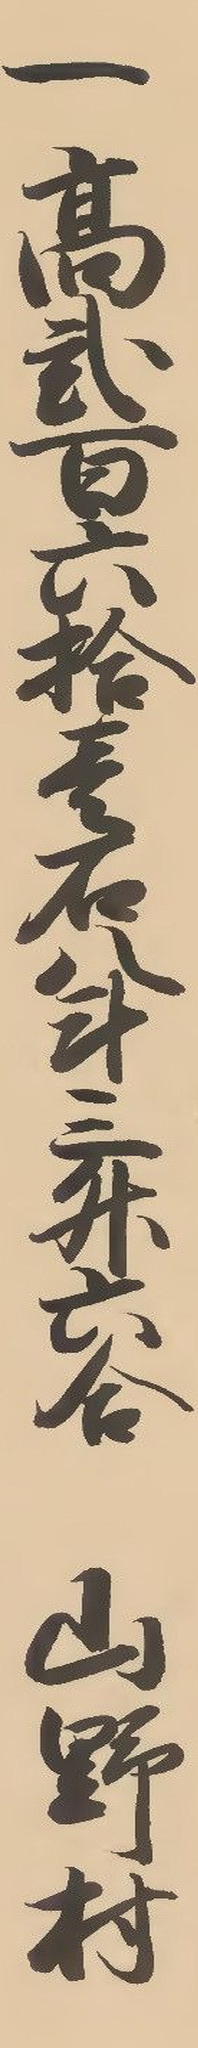一高弐百六拾壱石八斗三升六合山野村
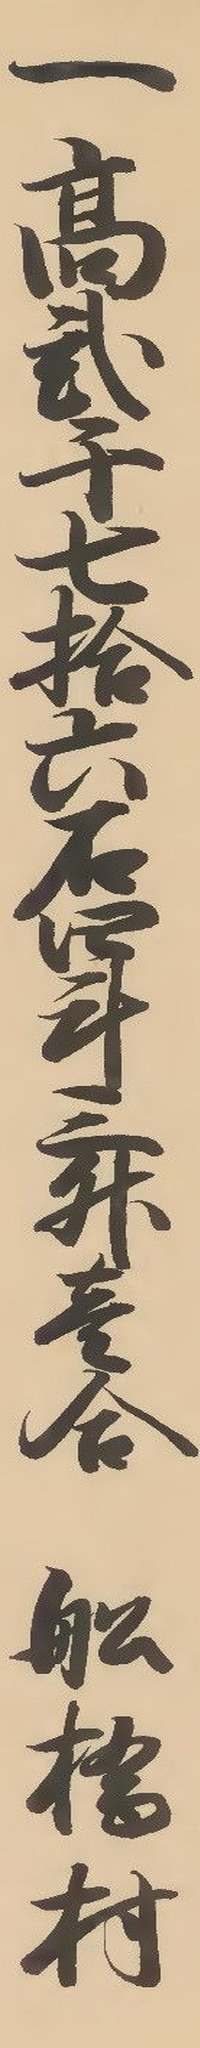一高弐千七拾六石四斗三升壱合船橋村
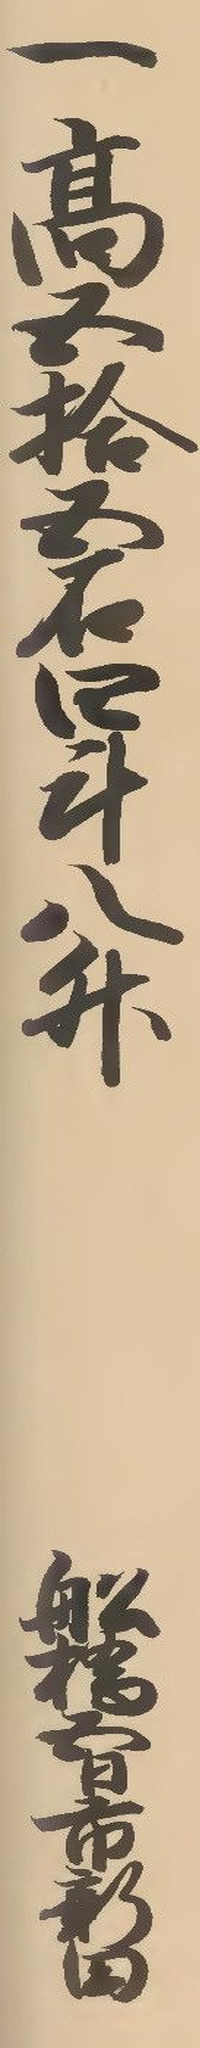一高五拾五石四斗八升船橋五日市新田
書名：下総国郷帳
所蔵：国立公文書館 National Archives of Japan
